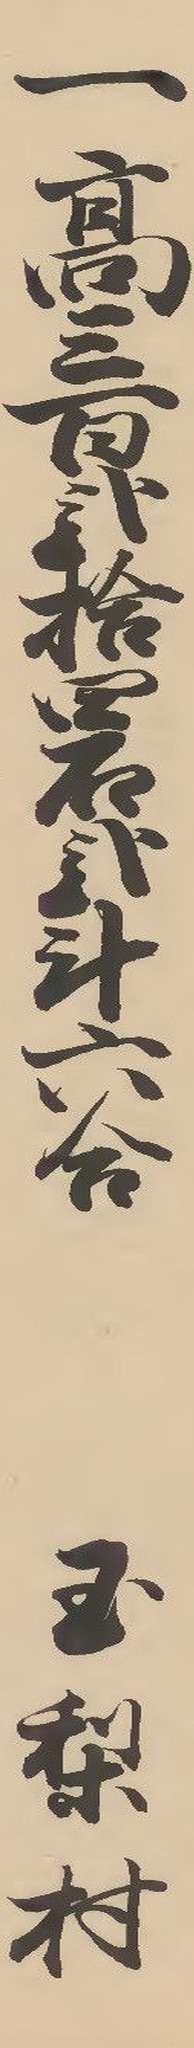一高三百弐拾四石弐斗六合玉梨村
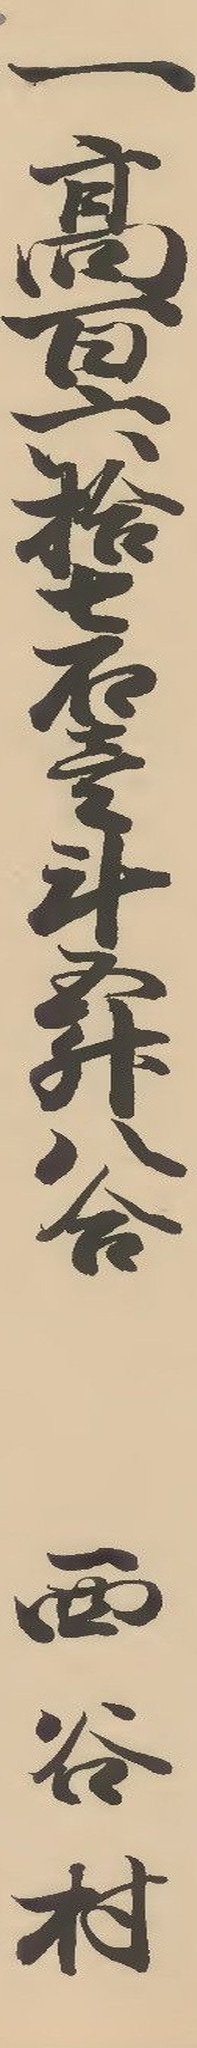一高百六拾七石壱斗五升八合西谷村
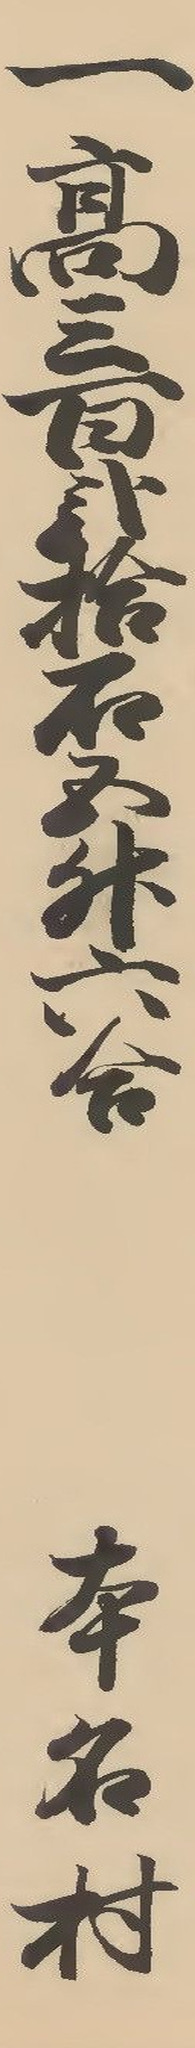一高三百弐拾石五升六合本名村
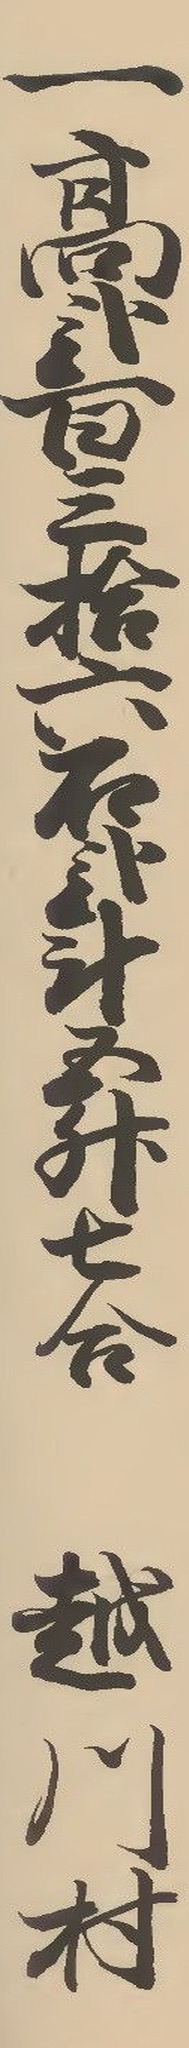一高弐百三拾六石弐斗五升七合越川村
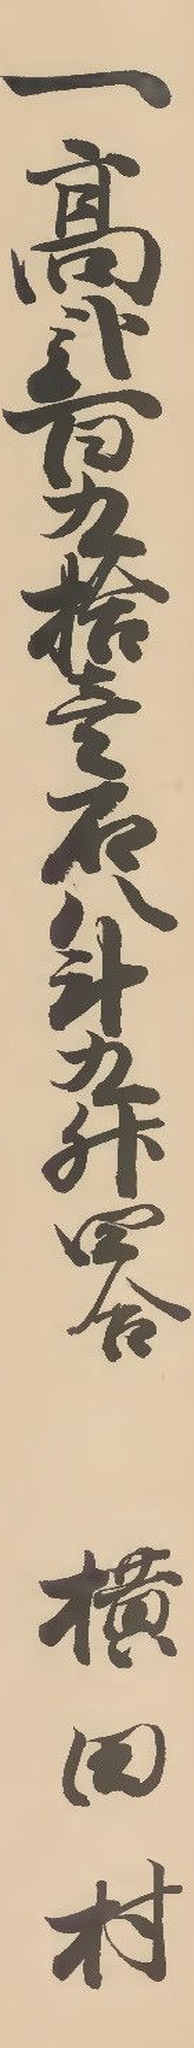一高弐百九拾壱石八斗九升四合横田村
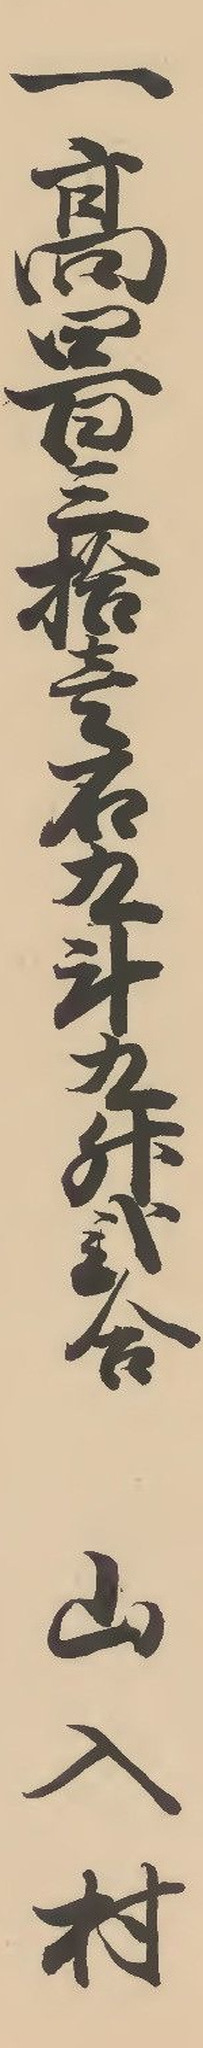一高四百三拾壱石九斗九升弐合山入村
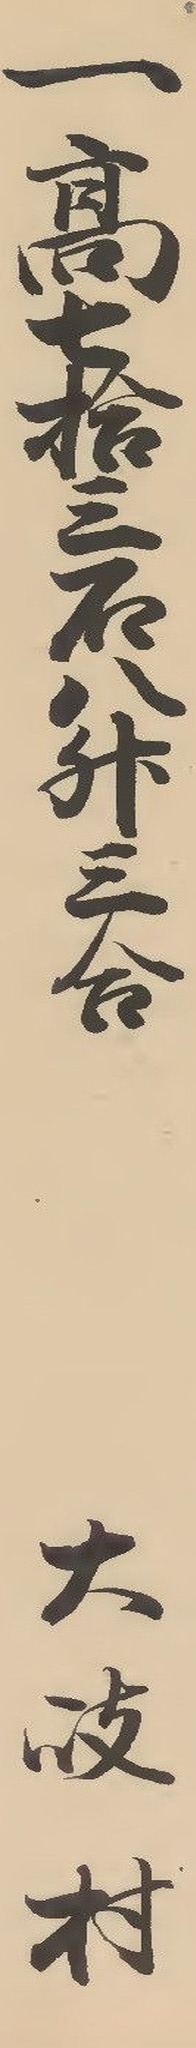一高七拾三石八升三合大岐村
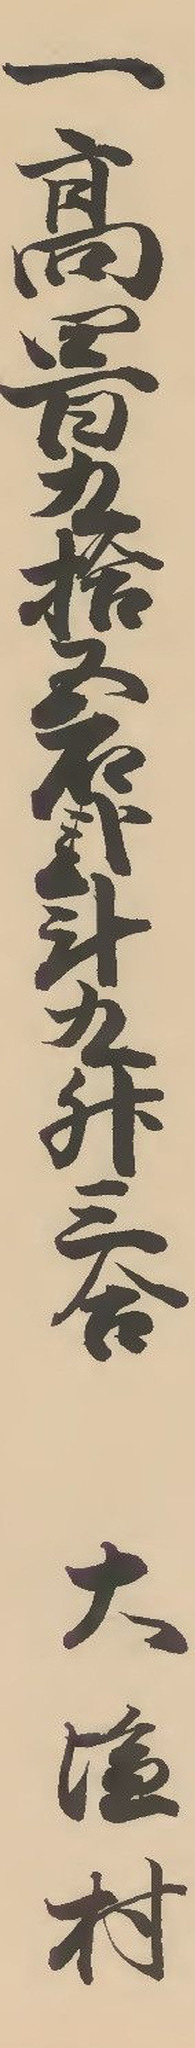一高四百九拾五石弐斗九升三合大塩村

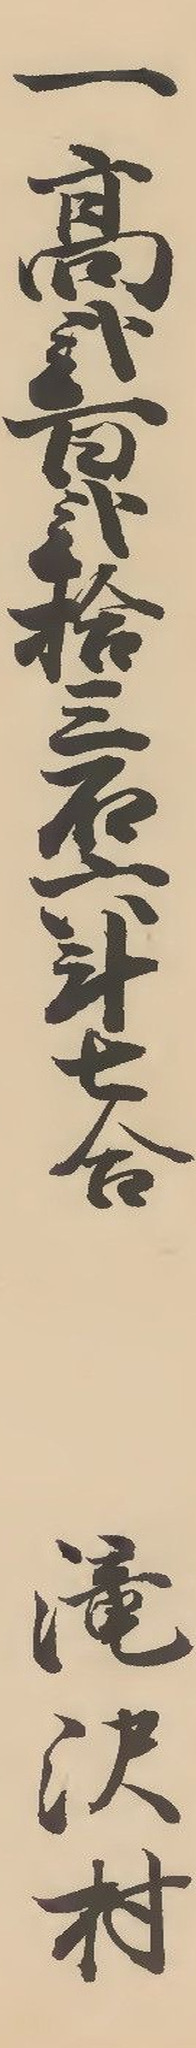一高弐百弐拾三石六斗七合滝沢村
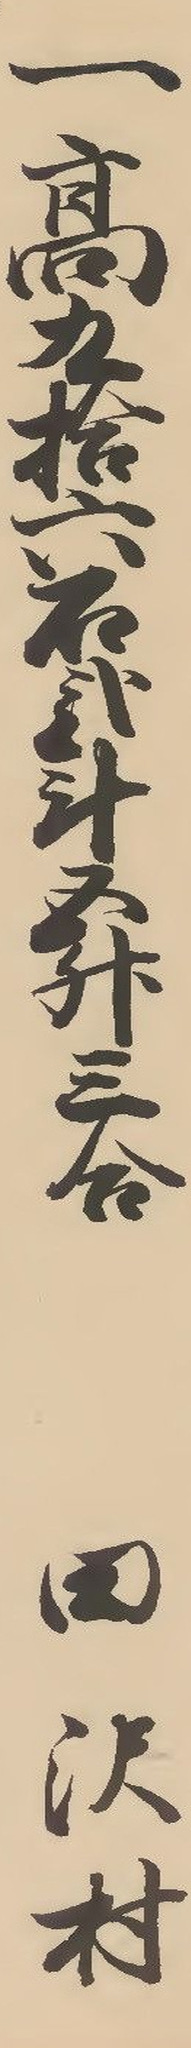一高九拾六石弐斗五升三合田沢村
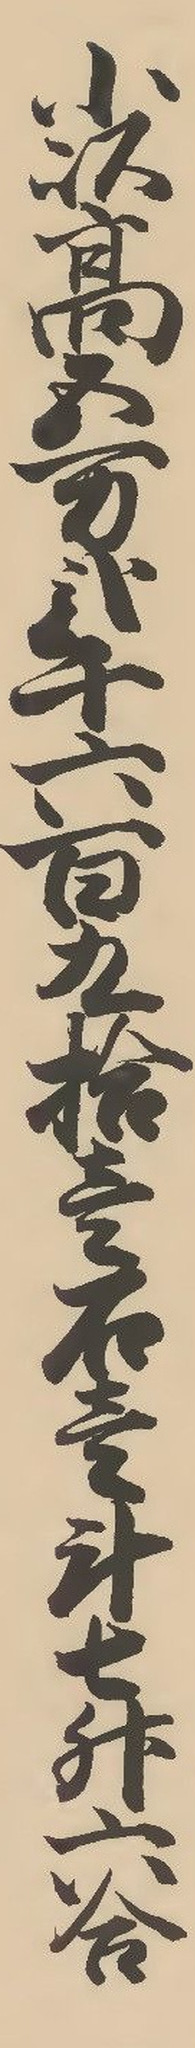小以高五万弐千六百九拾壱石壱斗七升六合
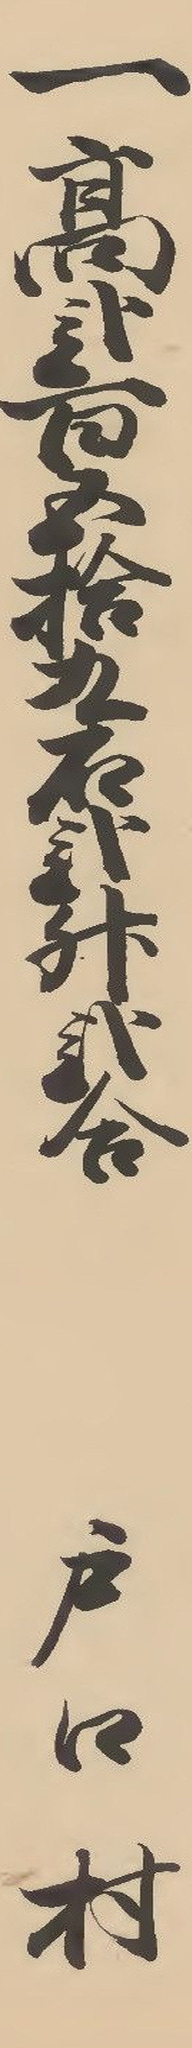一高弐百五拾九石弐升弐合戸口村
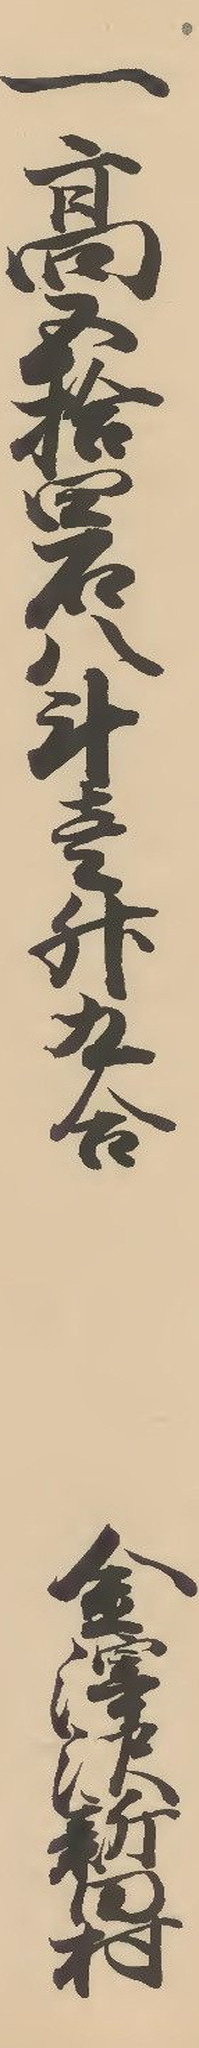一高五拾四石八斗壱升九合金滓沢新田村
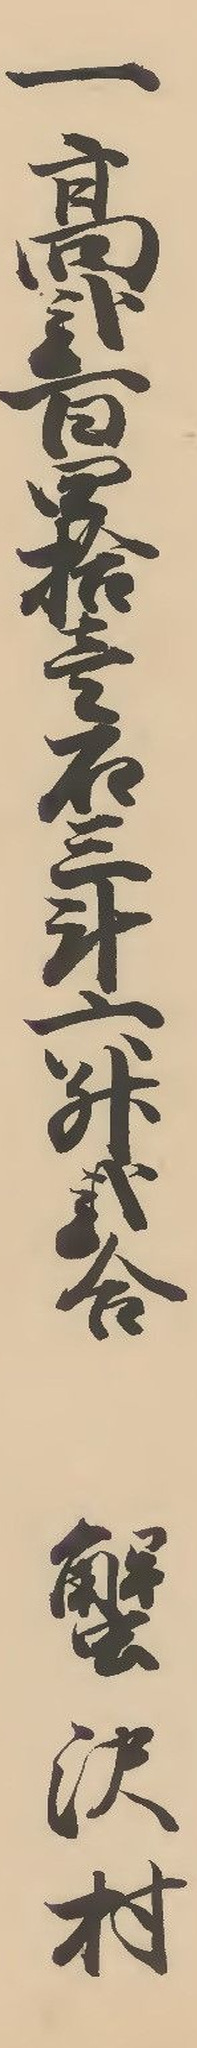一高弐百四拾壱石三斗六升弐合蟹沢村

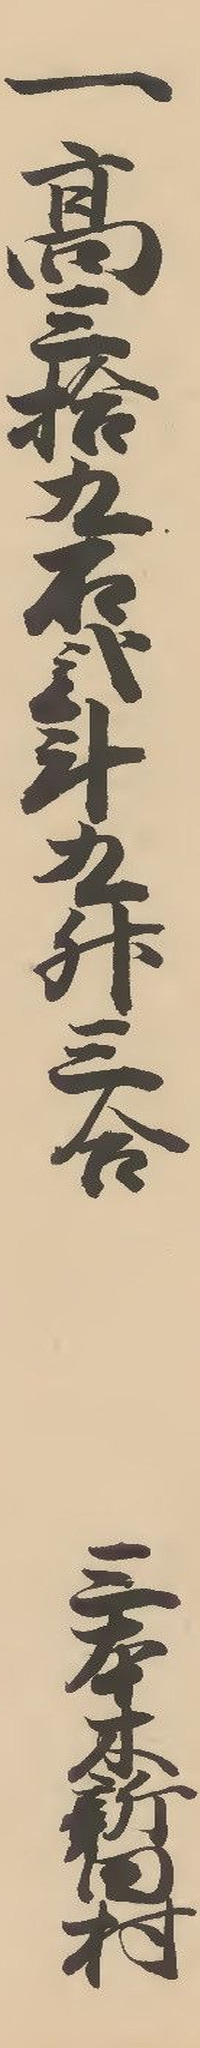一高三拾九石弐斗九升三合三本木新田村
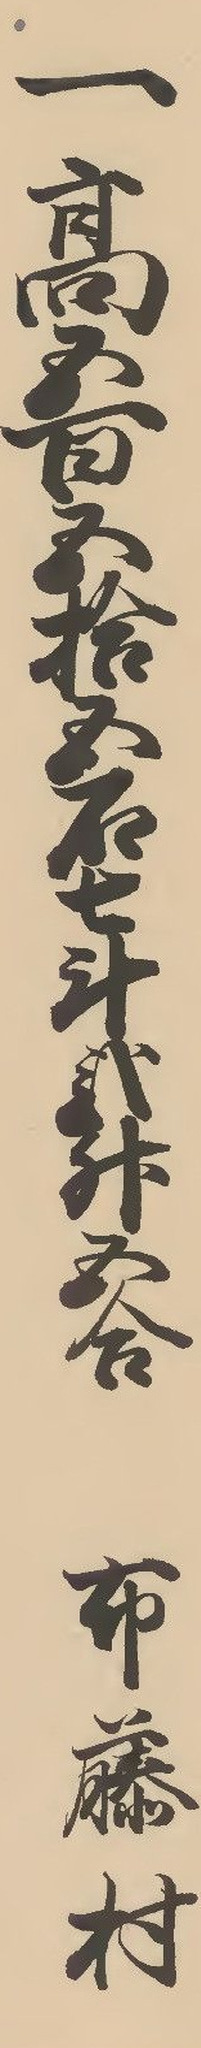一高五百五拾五石七斗弐升五合布藤村
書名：陸奥国郷帳　１
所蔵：国立公文書館 National Archives of Japan
